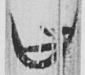曰
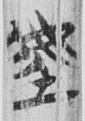○（吾）
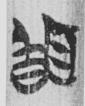○（聞）
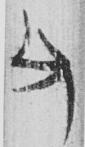父
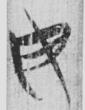母
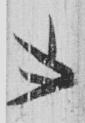之
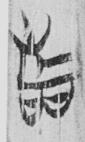喪
